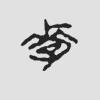李
